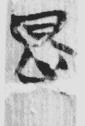𠭁
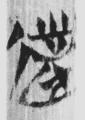{人菐臣}
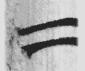二
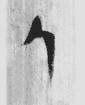人
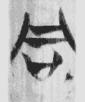同
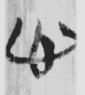心
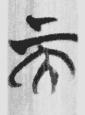而
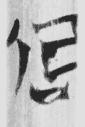{人己口}
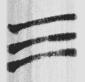三
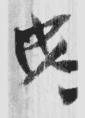𡚦
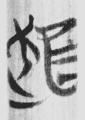𧻚
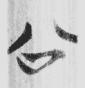公
